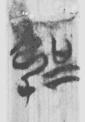{弓口二}
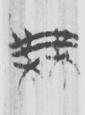無
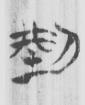型
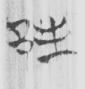邦
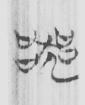器
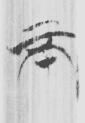不
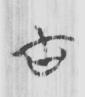古
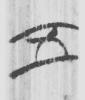五
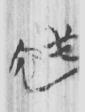{衣弋}
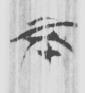不
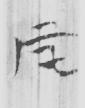厇
